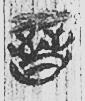晉
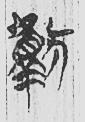獻
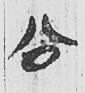公
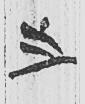之
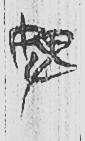婢
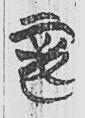妾
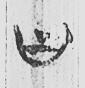曰
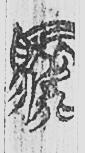驪
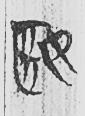姬
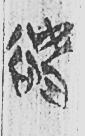欲
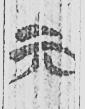亓
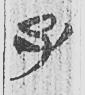子
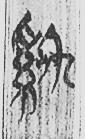{奚人九}
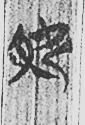{次肉}
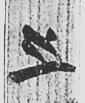之
